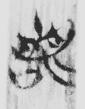若
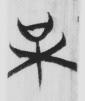某
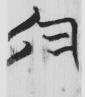今
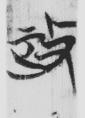政
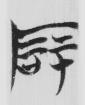{石主}
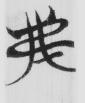弗
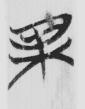果
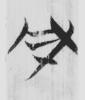凡
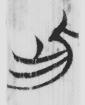此
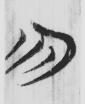勿
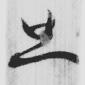也
